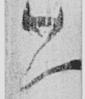也
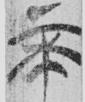不
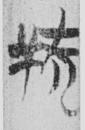○（幸）
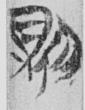則
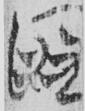取
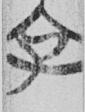○（免）
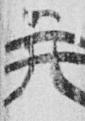而
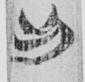出
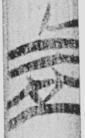者（諸）
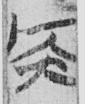侯（侯）
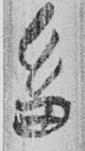畜
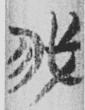我
